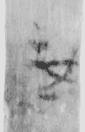{十五}
